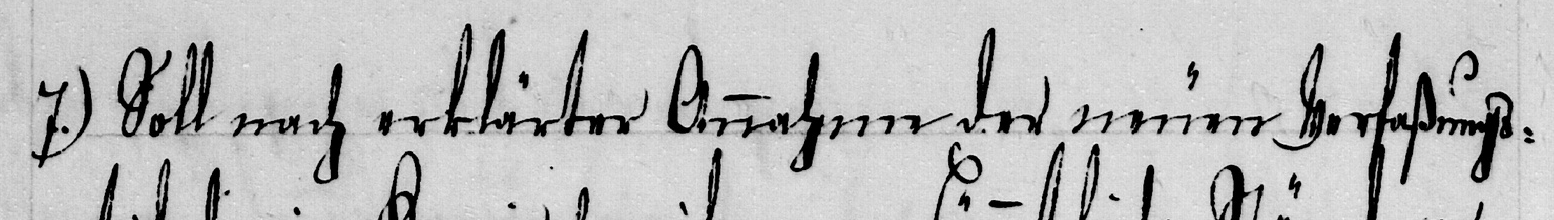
7.) Soll nach erklärter Annahme der neuen Verfaßung¬
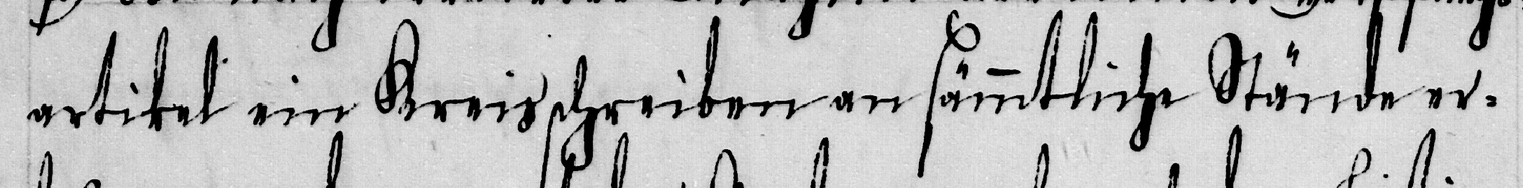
sartikel ein Kreisschreiben an sämmtliche Stände er¬
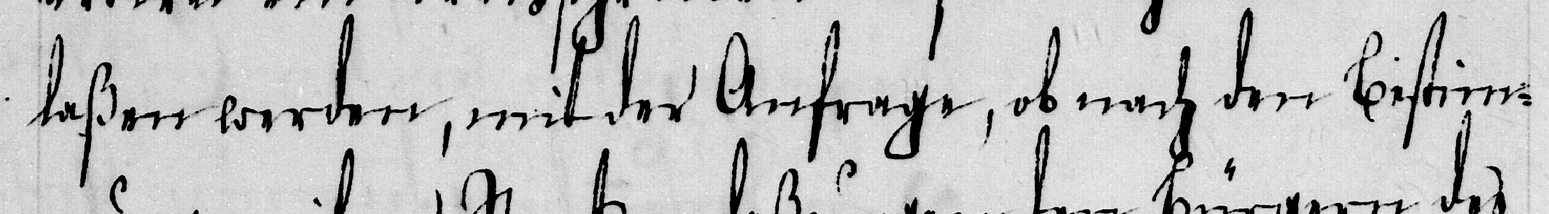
laßen werden, mit der Anfrage, ob nach den Bestim¬
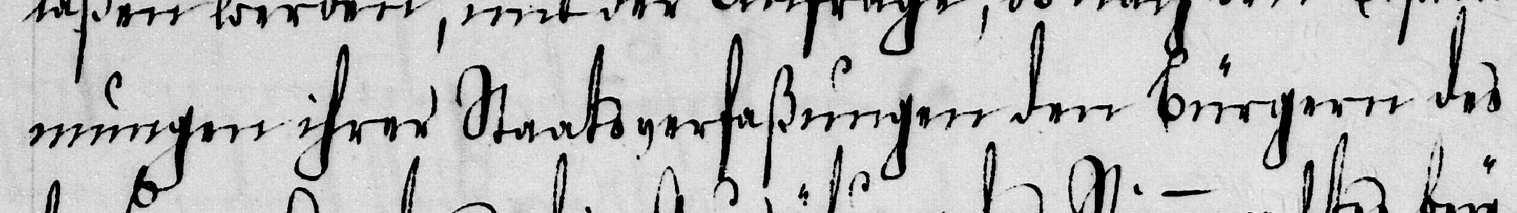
mungen ihrer Staatsverfaßungen den Bürgern des
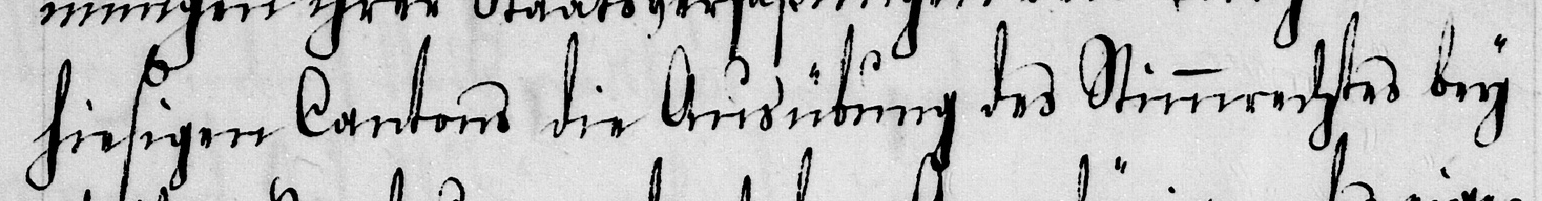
hiesigen Cantons die Ausübung des Stimmrechtes bey
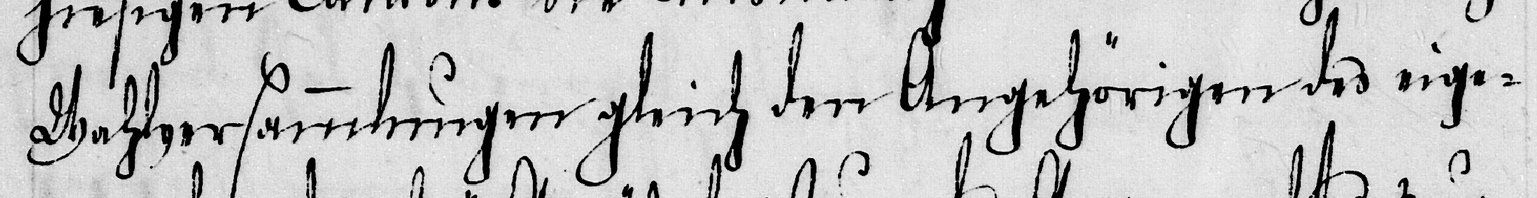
Wahlversammlungen gleich den Angehörigen des eige¬
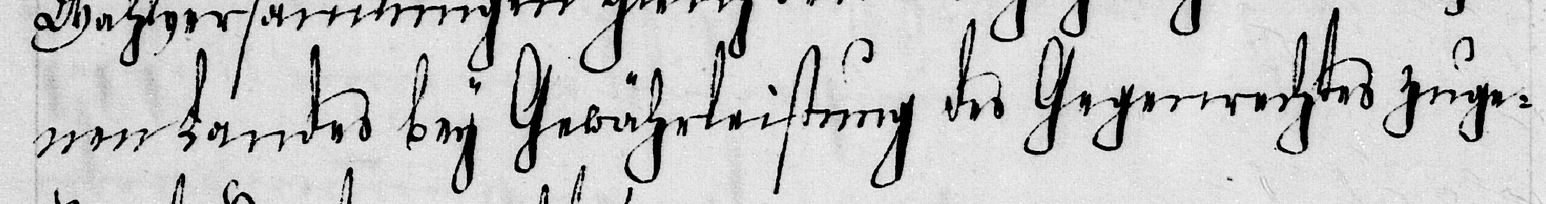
nen Landes bey Gewährleistung des Gegenrechtes zuges¬
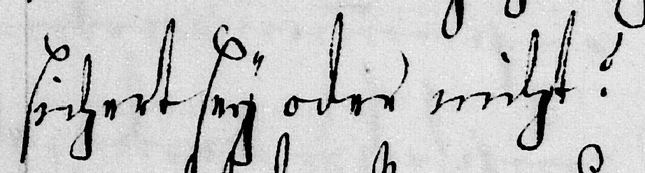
ichert sey oder nicht?
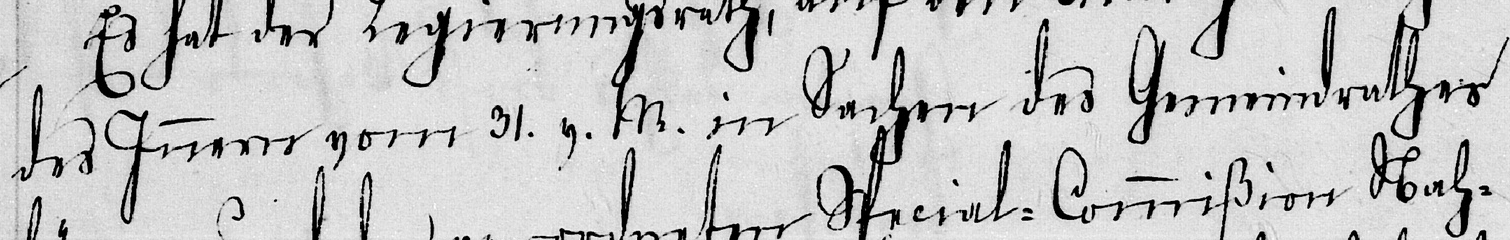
des Innern vom 31. v. M. in Sachen des Gemeindrathes
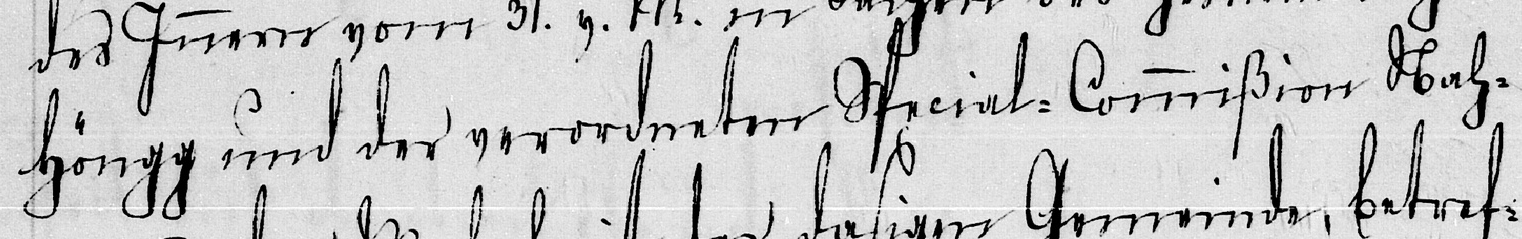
Höngg und der verordneten Special-Commißion Nah¬
